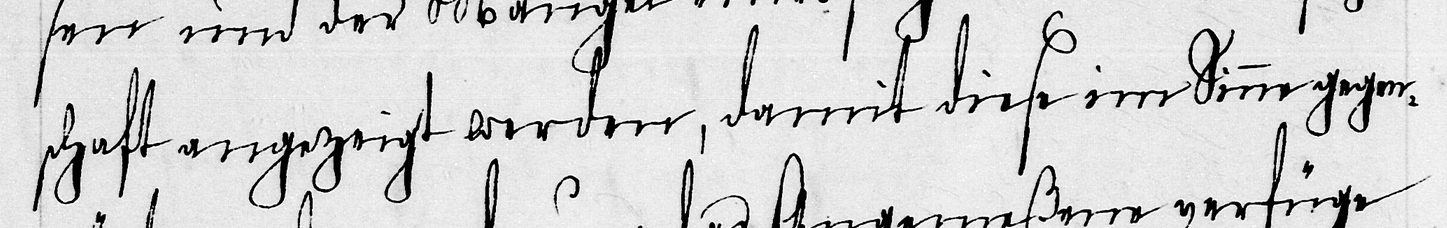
schaft angezeigt werden, damit diese im Sinne gegen¬
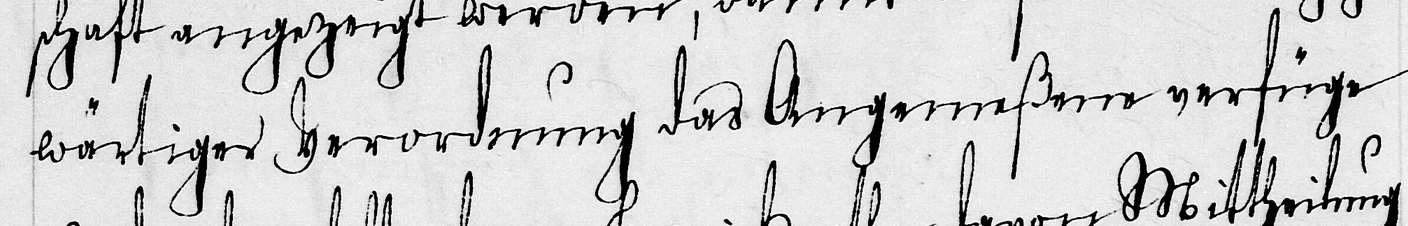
wärtiger Verordnung das Angemeßene verfüge
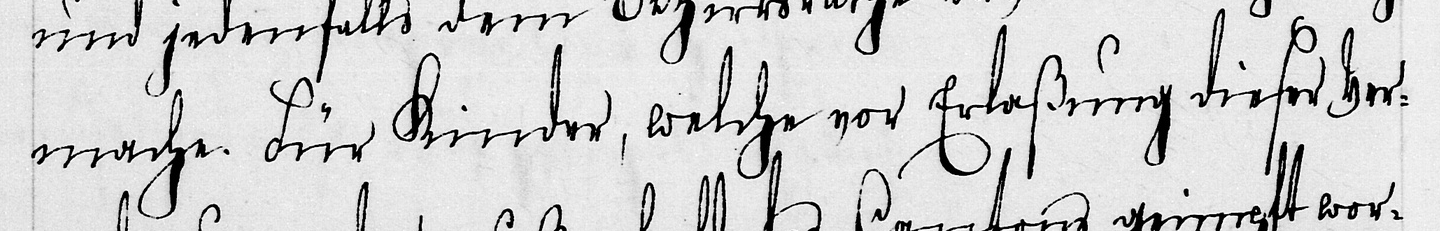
mache. Für Kinder, welche vor Erlaßung dieser Ver¬
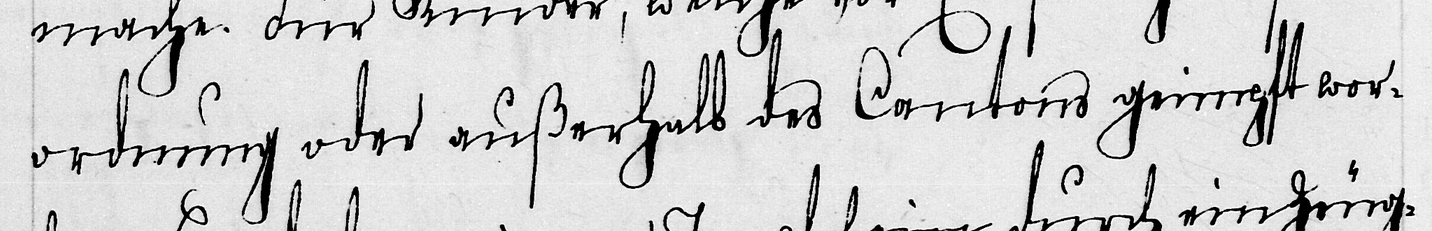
ordnung oder außerhalb des Cantons geimpft wor¬
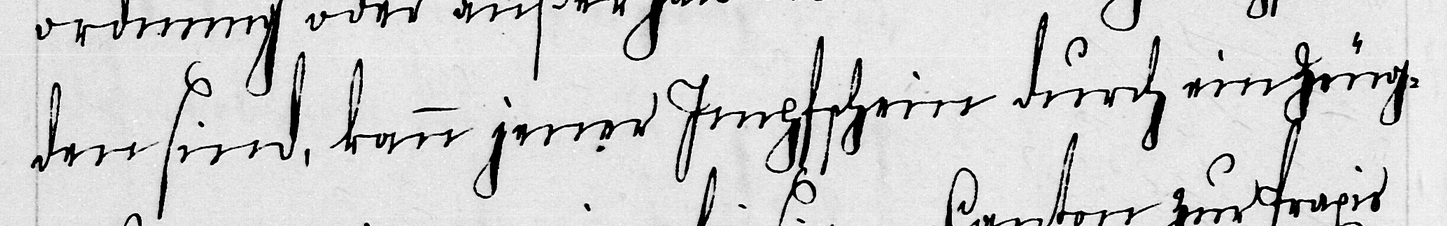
den sind, kann jener Impfschein durch ein Zeug¬
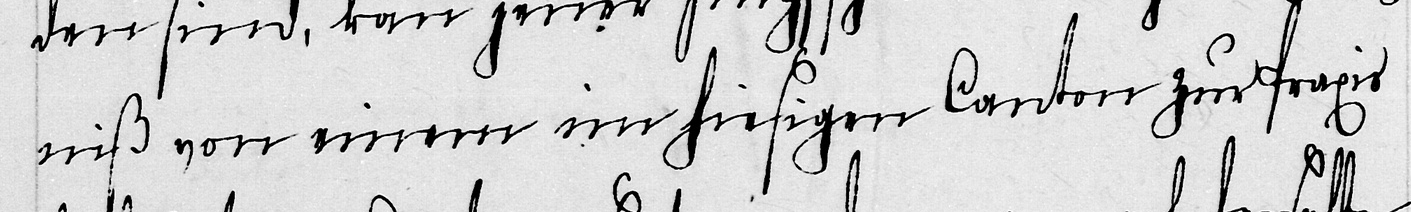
niß von einem im hiesigen Canton zur Praxis
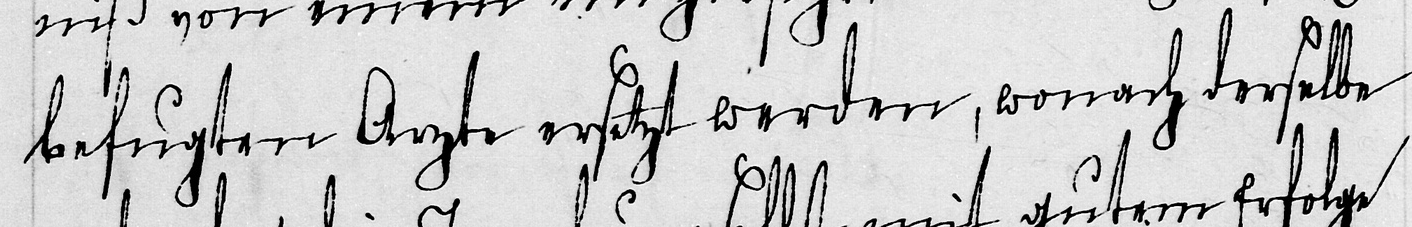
befugten Arzte ersetzt werden, wonach derselbe
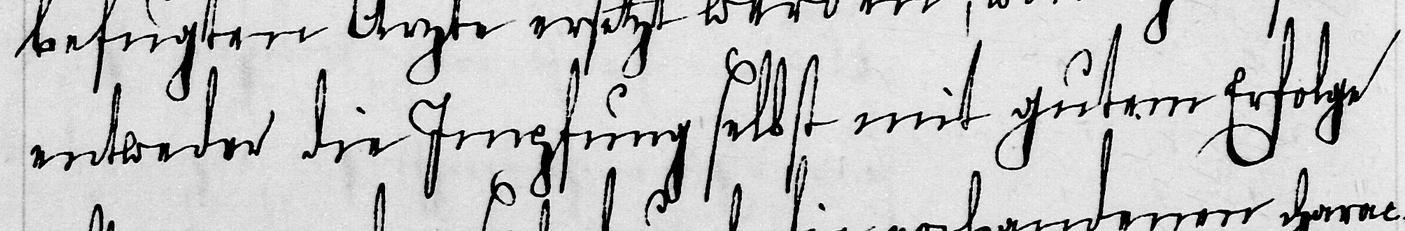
entweder die Impfung selbst mit gutem Erfolge
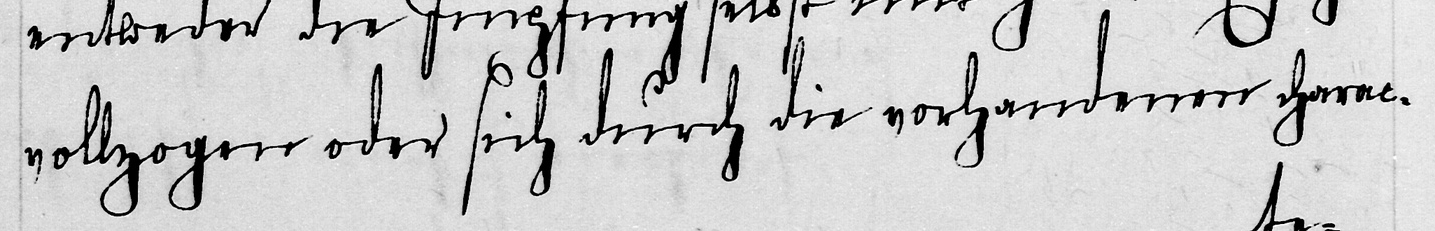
vollzogen oder sich durch die vorhandenen charac-
